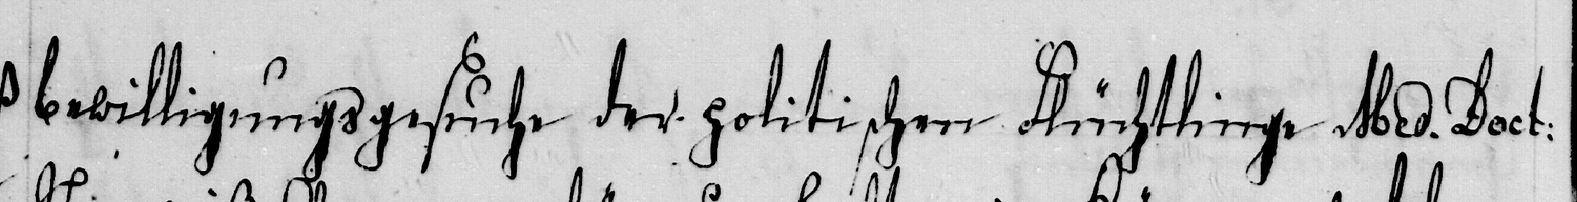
bewilligungsgesuche der politischen Flüchtlinge Med. Doct:
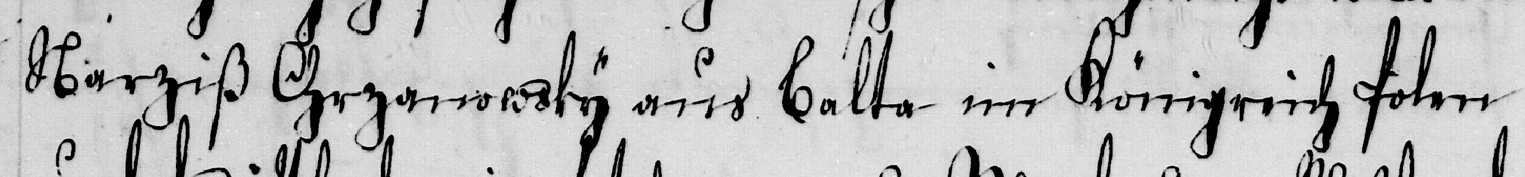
Narziß Chrzanawsky aus Balta im Königreich Polen
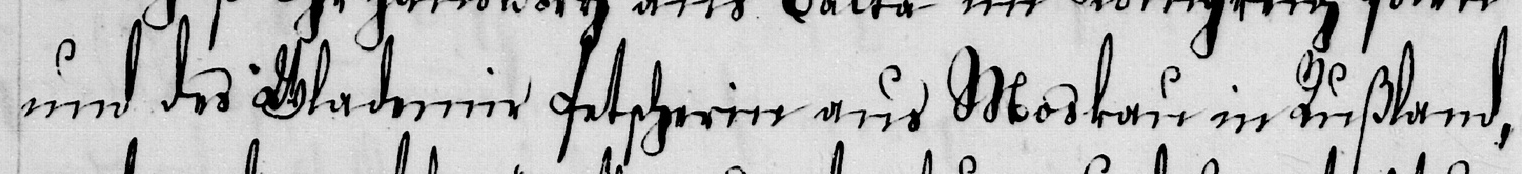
und des Wladimir Petscherin aus Moskau in Rußland,
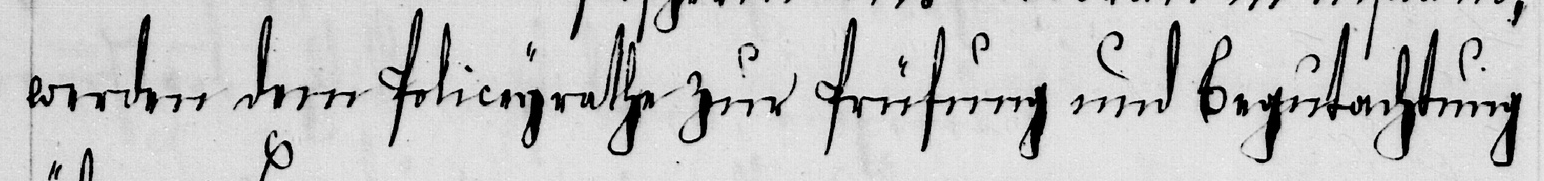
werden dem Policeyrathe zur Prüfung und Begutachtung
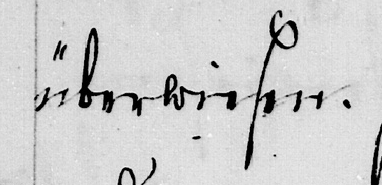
überwiesen.
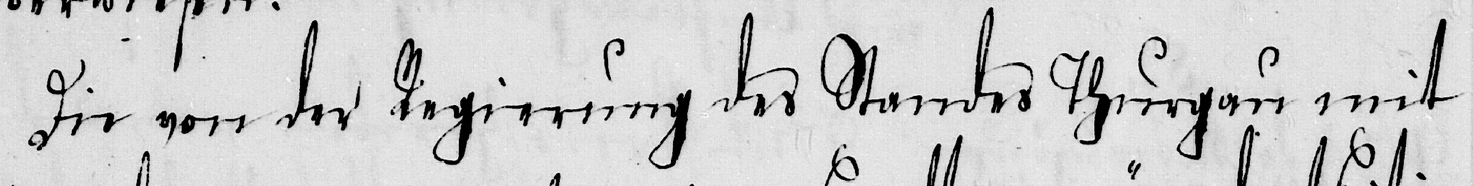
Die von der Regierung des Standes Thurgau mit
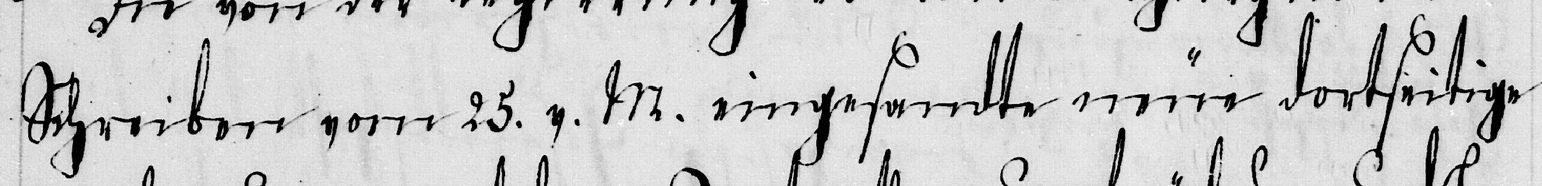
Schreiben vom 25. v. M. eingesandte neue dortseitige
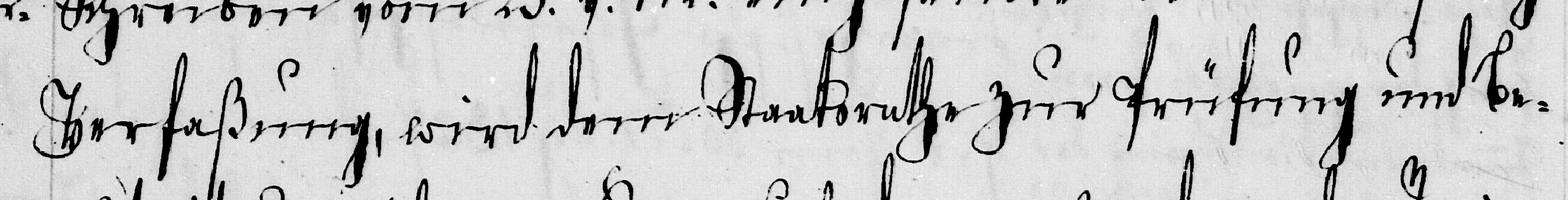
Verfaßung, wird dem Staatsrathe zur Prüfung und Be¬
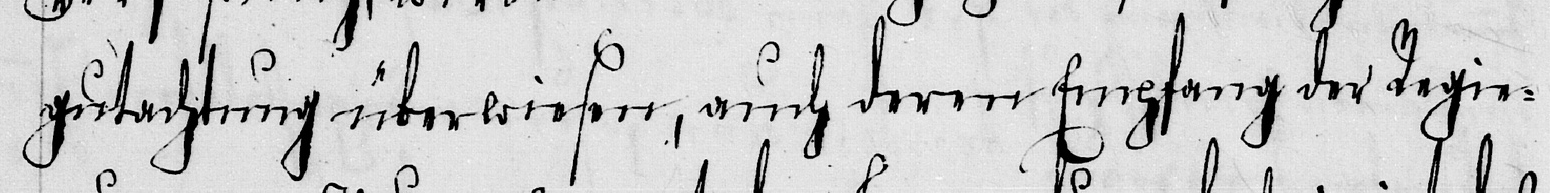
gutachtung überwiesen, auch deren Empfang der Regie¬
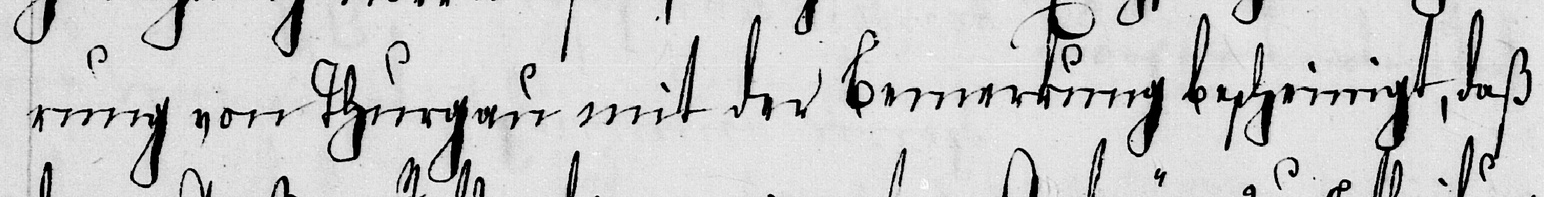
rung von Thurgau mit der Bemerkung bescheinigt, daß
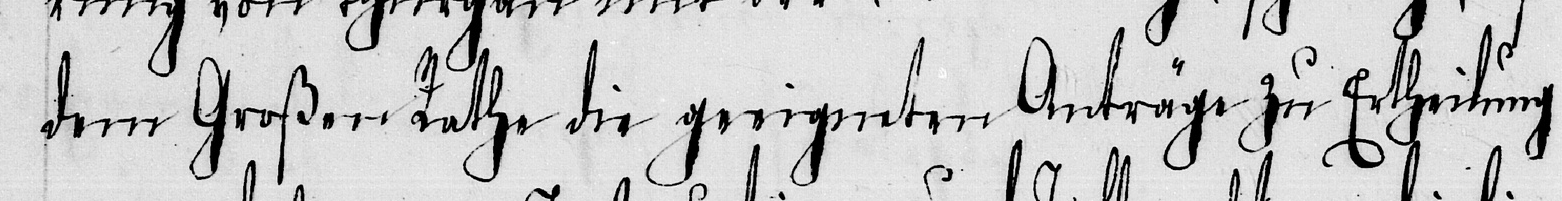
dem Großen Rathe die geeigneten Anträge zu Ertheilung
